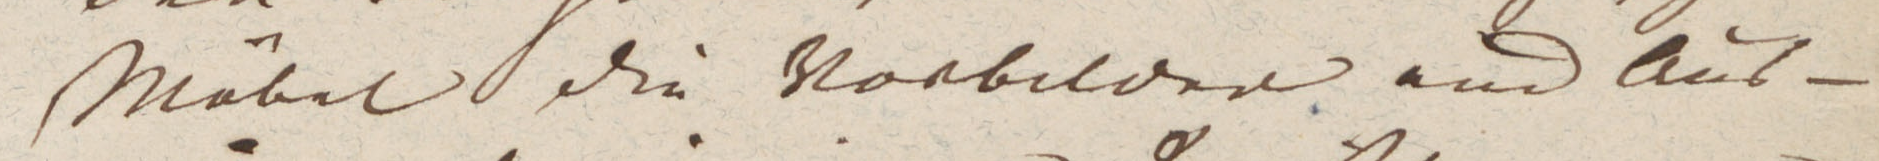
Möbel die Vorbilder und Aus-
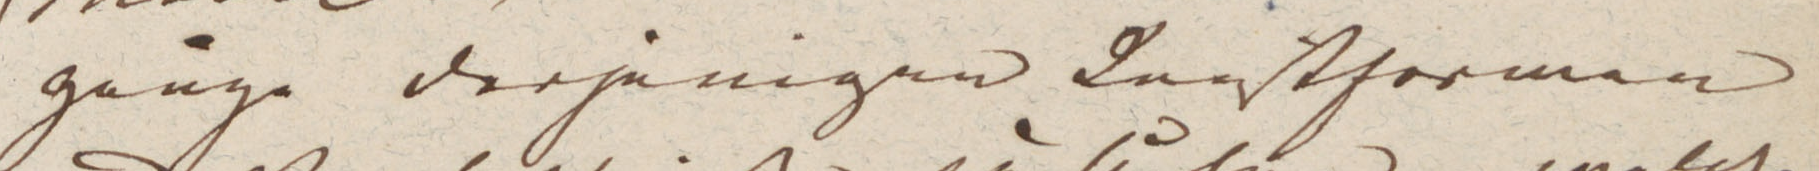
gänge derjenigen Kunstformen
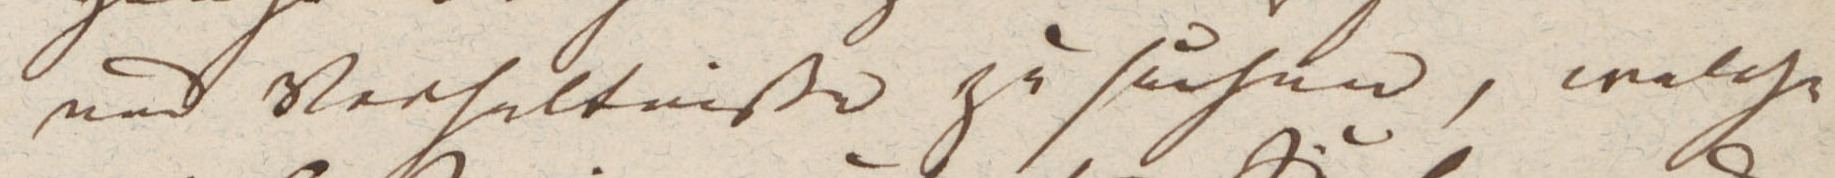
und Verhaltnisse zu suchen, welche
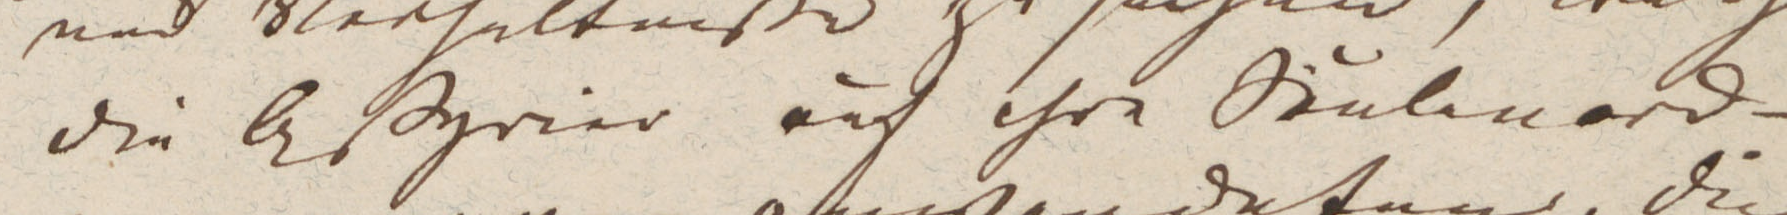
die Assyrier auf ihre Säulenord-
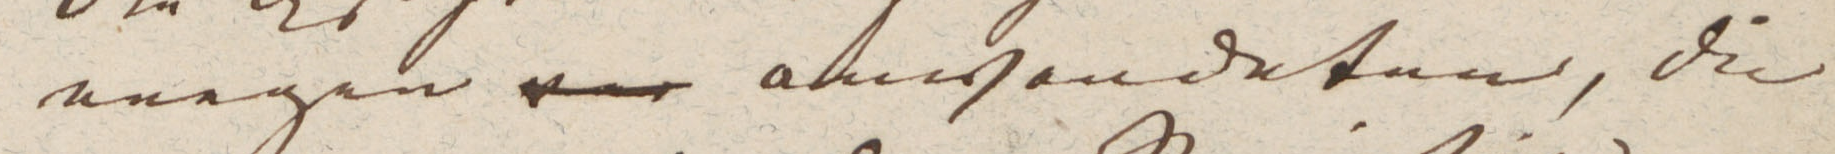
nungen vor anwendeten, die
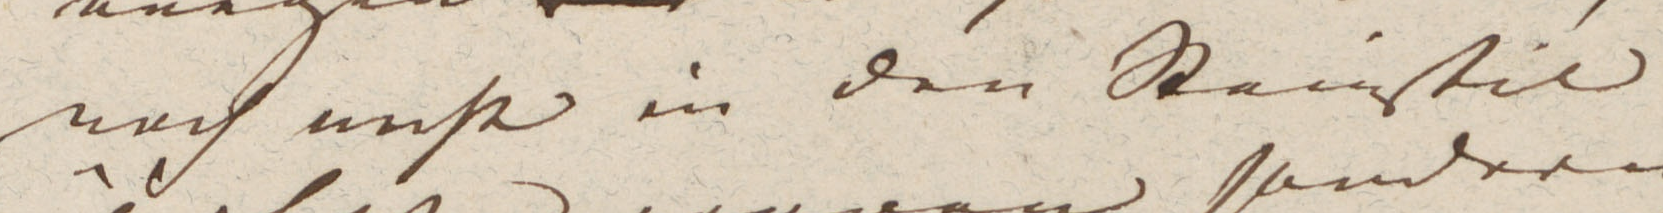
noch nicht in den Steinstil
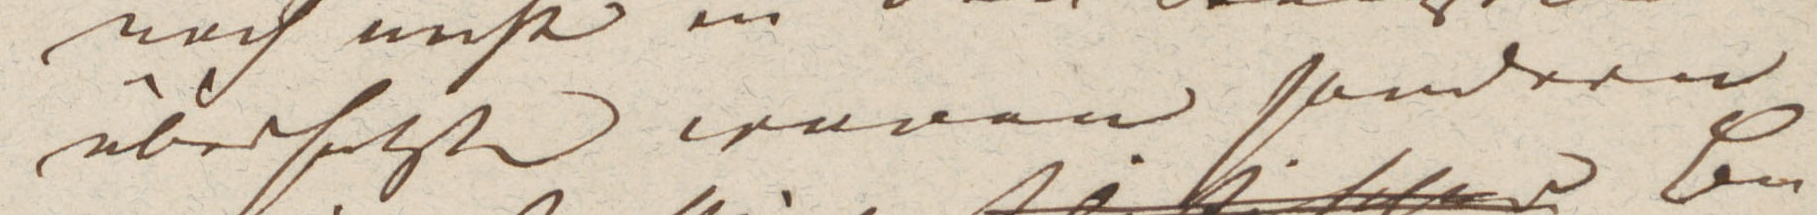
übersetzt waren sondern
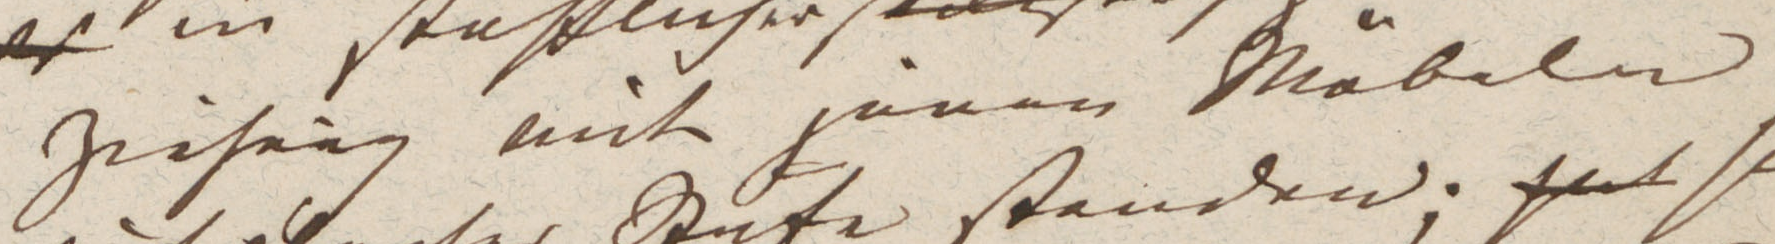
ziehung mit jenen Möbeln
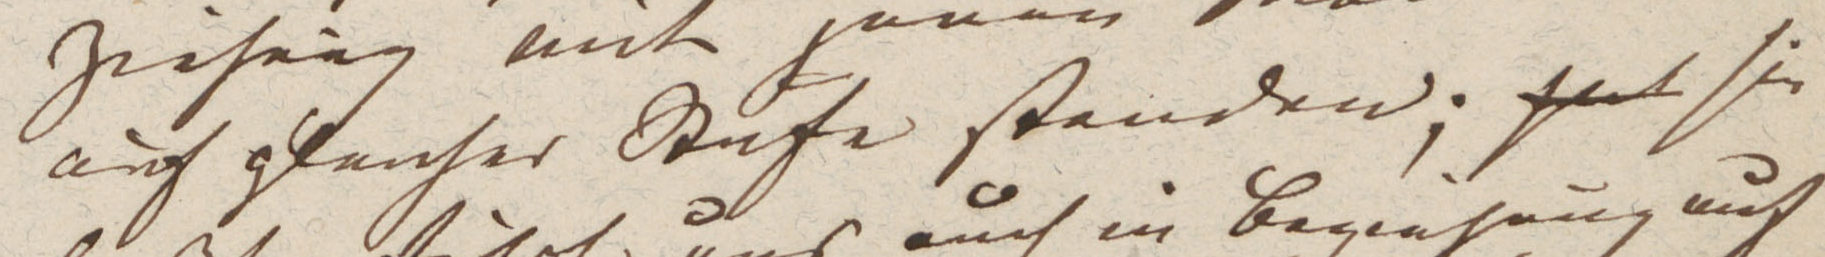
auf gleicher Stufe standen; s sie
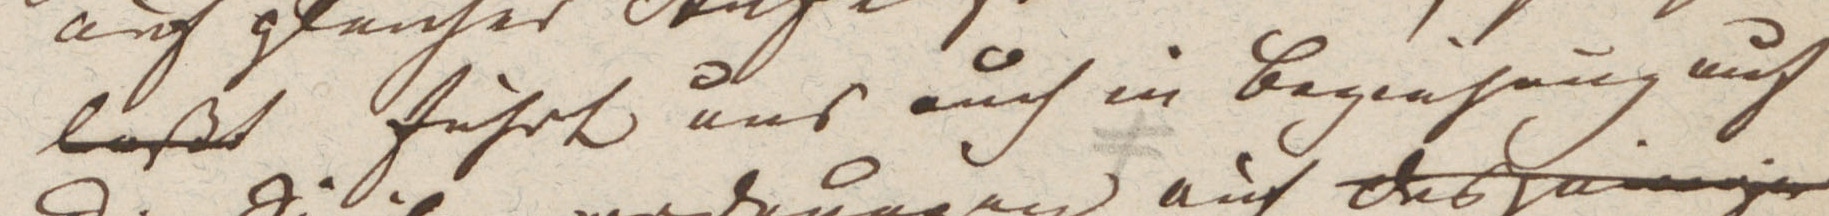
lasst führt uns auch in Beziehung auf
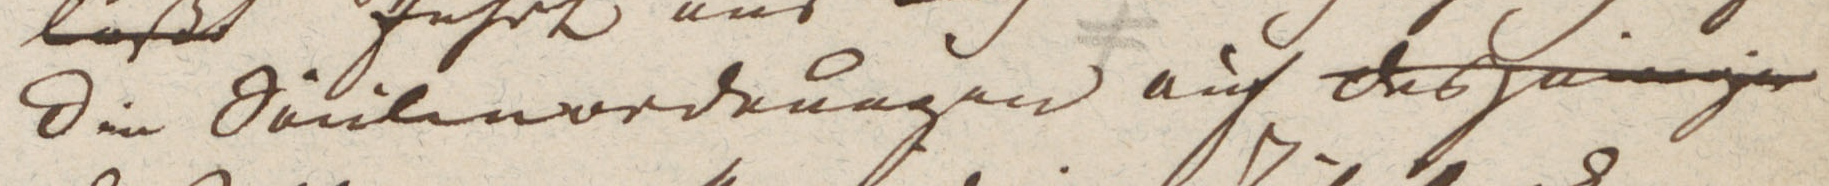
die Säulenordnungen % auf dasjenige
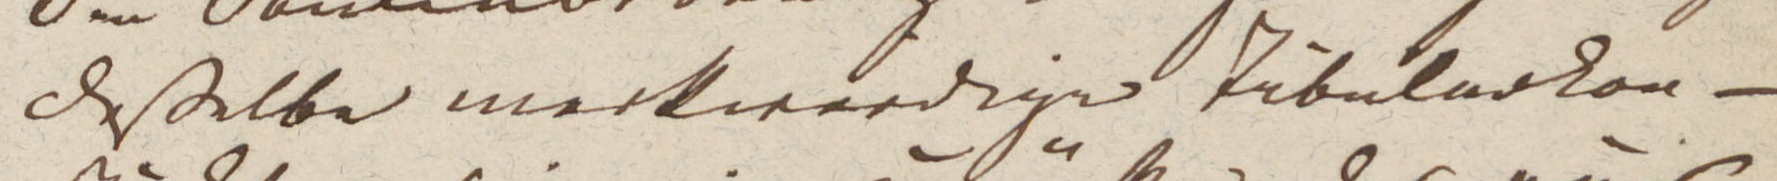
dasselbe merkwürdige Tubularkon-
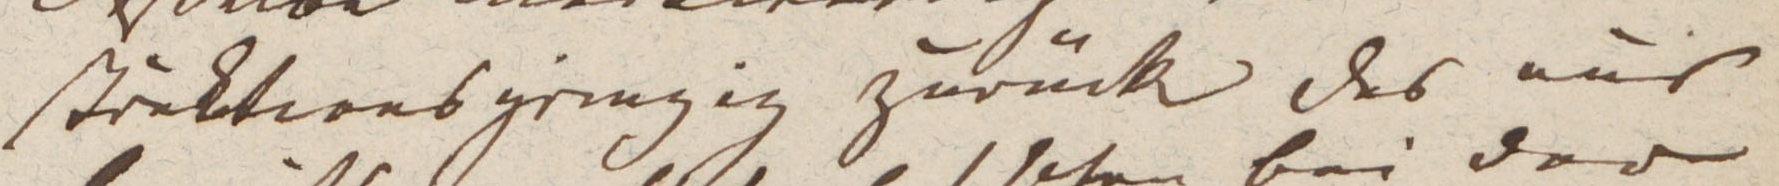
strucktionsprinzip zurück das uns
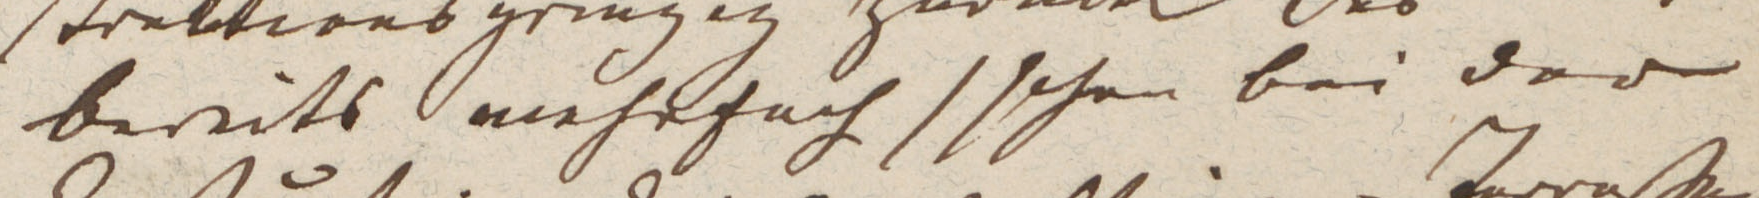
bereits mehrfach (schon bei der
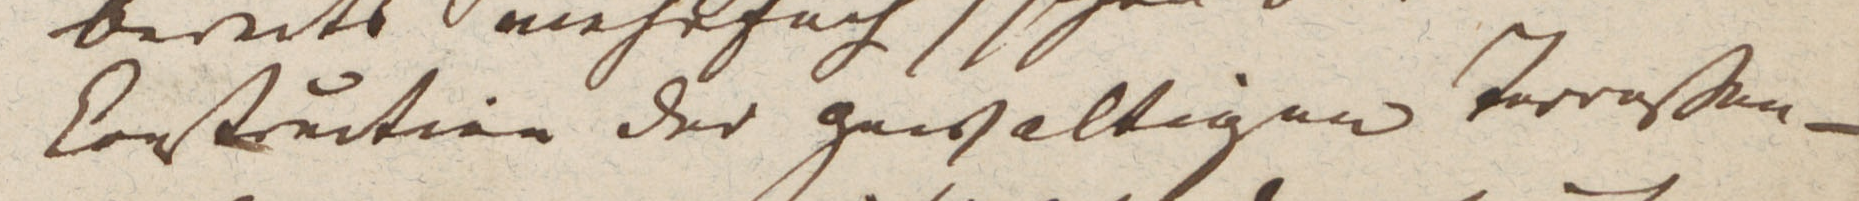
Construction der gewaltigen Terrassen-
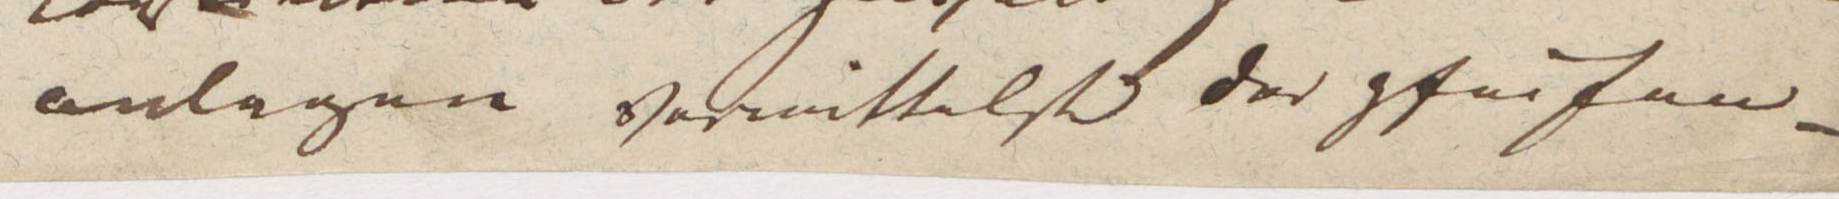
anlagen vermittelst der pfeifen-
